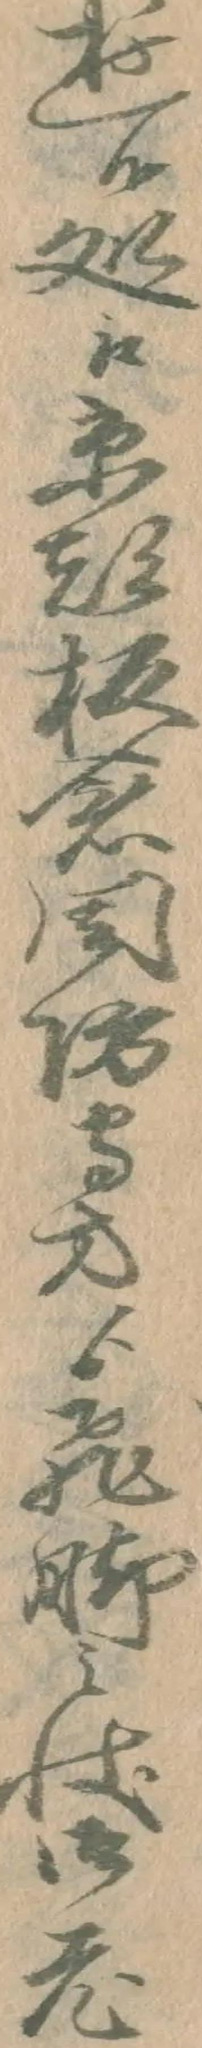遊候処え京都板倉周防守方ゟ飛脚之状御老
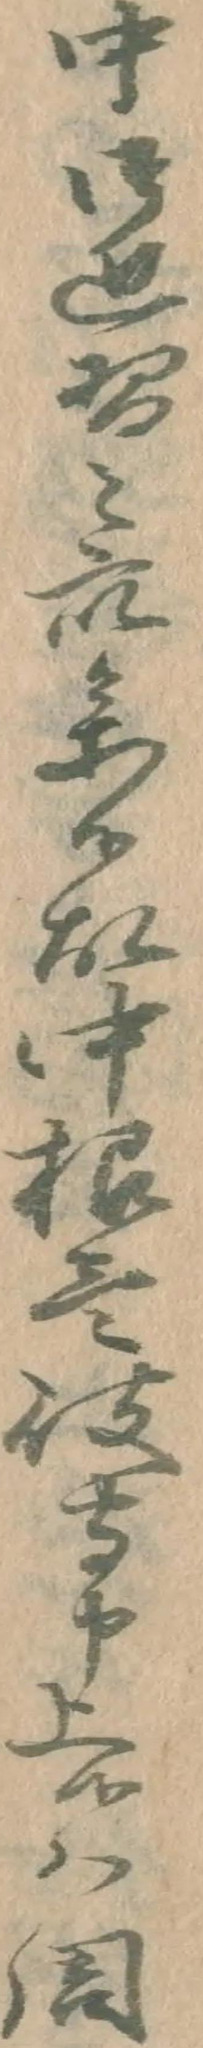中御近習之衆参候故中根壱岐守申上候は周
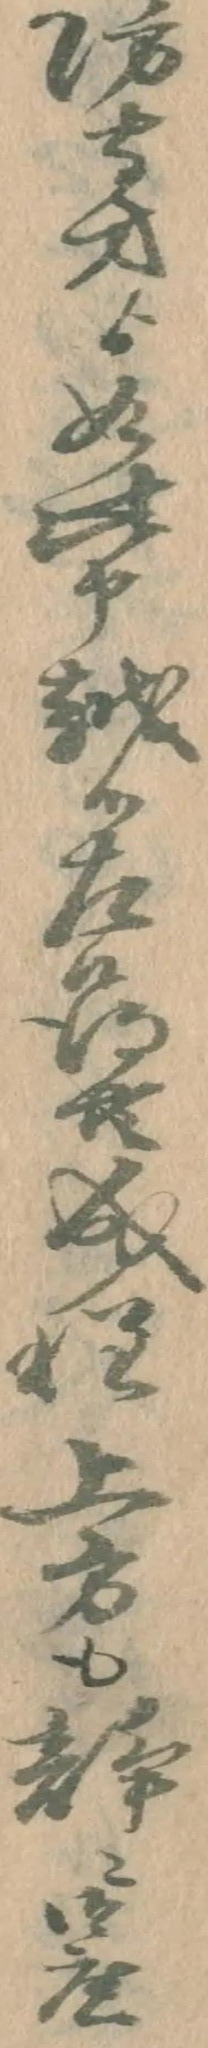防守方ゟ如此申越候左候得共成程上方も静に御座
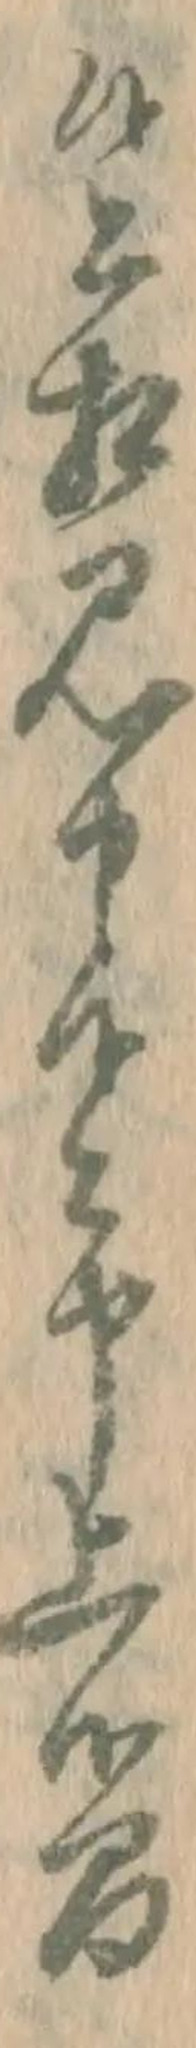候と相見申候と申上候間

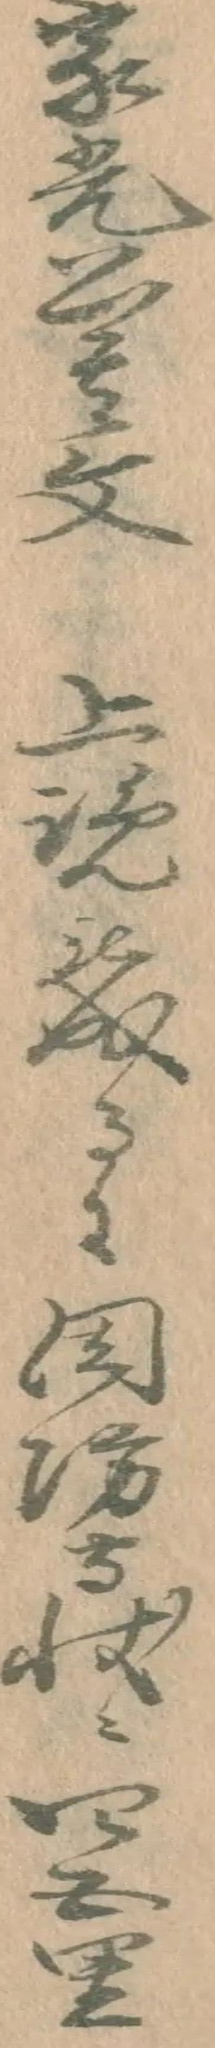家光公其文上覧被成るに周防守状に四五里
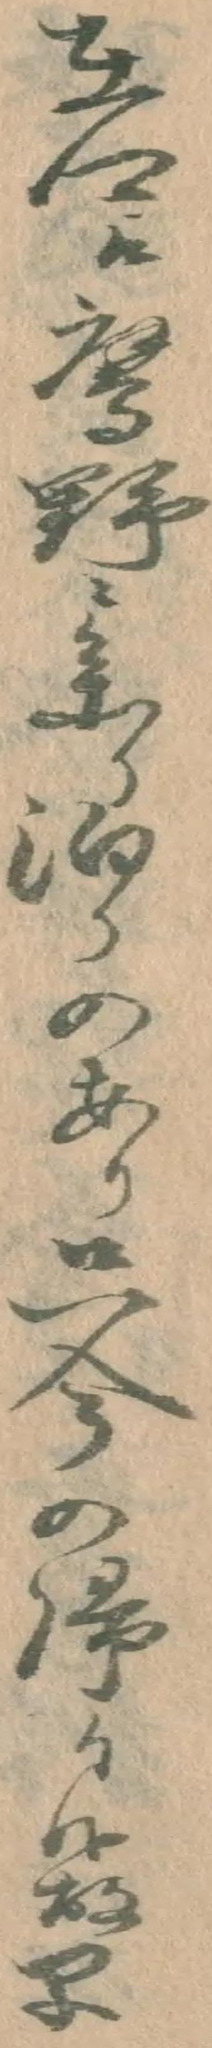在郷え鷹野に参り泊りのあり只今の帰り候故早
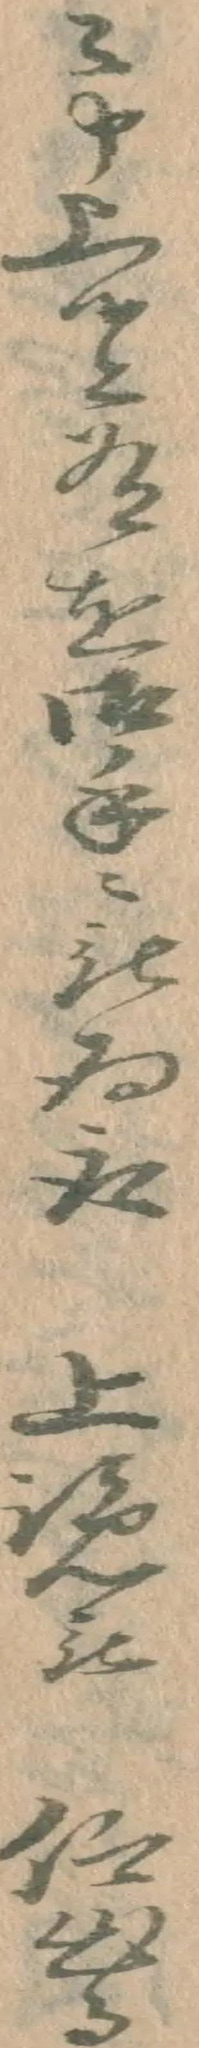々申上候と有を御手に被為取上覧被仰出る
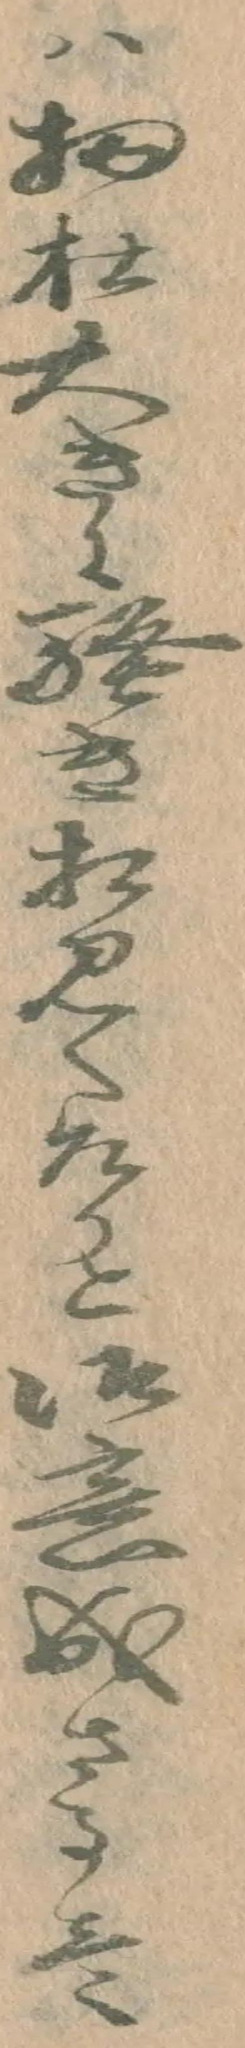は扨社大きに騒き相見へたりと御意成さる壱
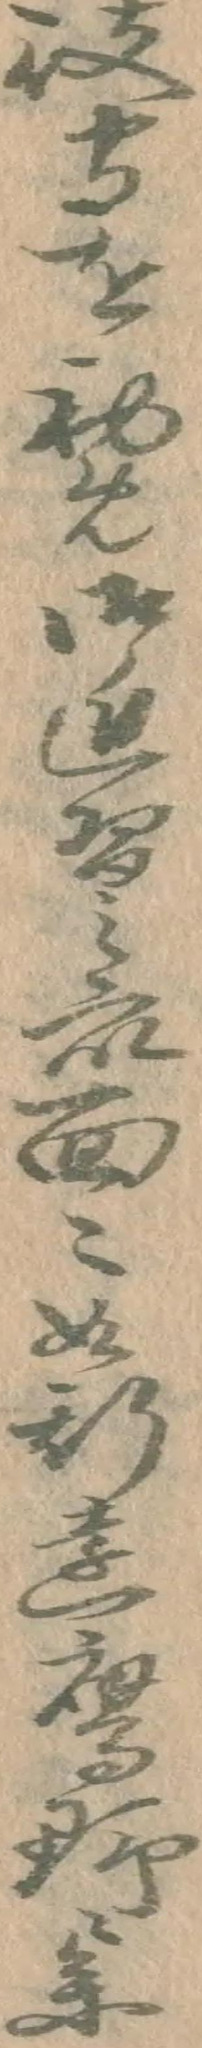岐守を初め御近習之衆面々如斯遠鷹野に参
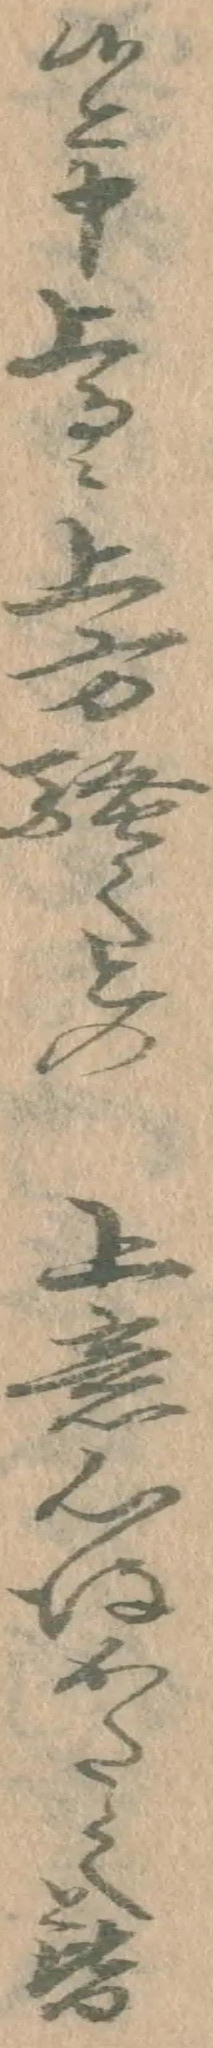候と申上るに上方騒くとの上意心得かたくと皆
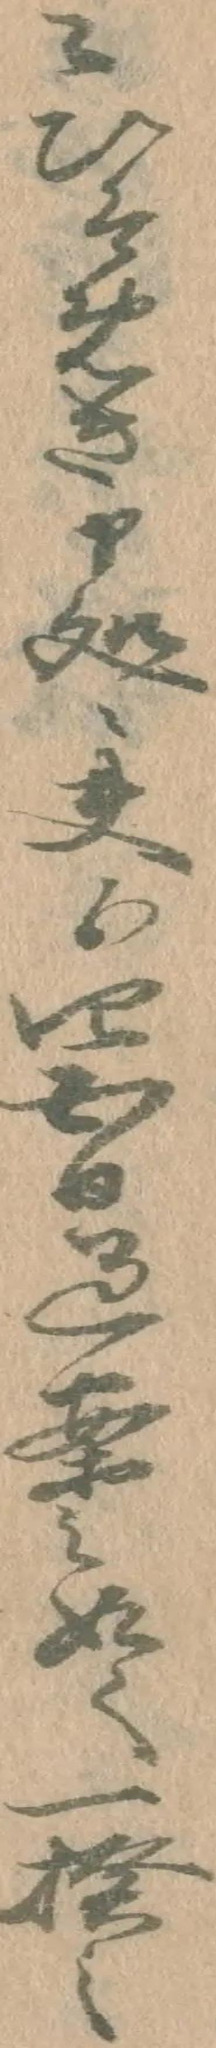々ひそめき申処に夫ゟ四五日過案之如く一揆之
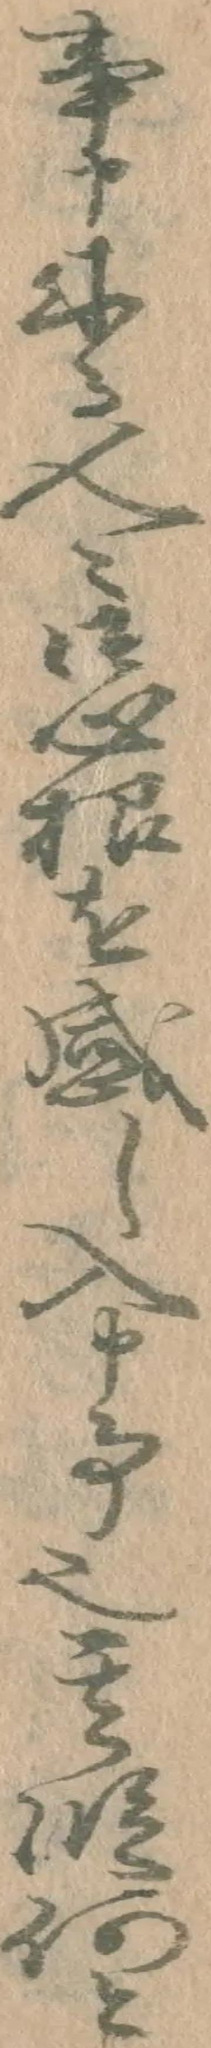事申来る人々御心根を感し入申事也其段何と
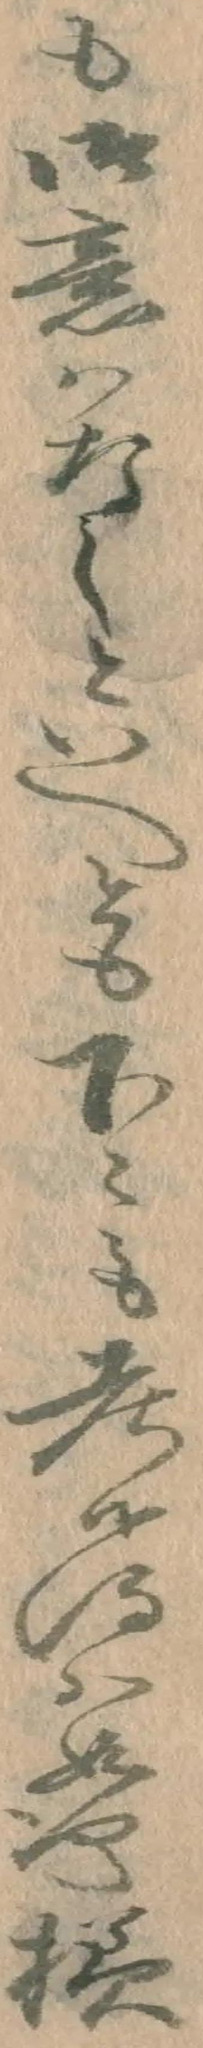も御意はなしといへとも下々も考候得は如何様
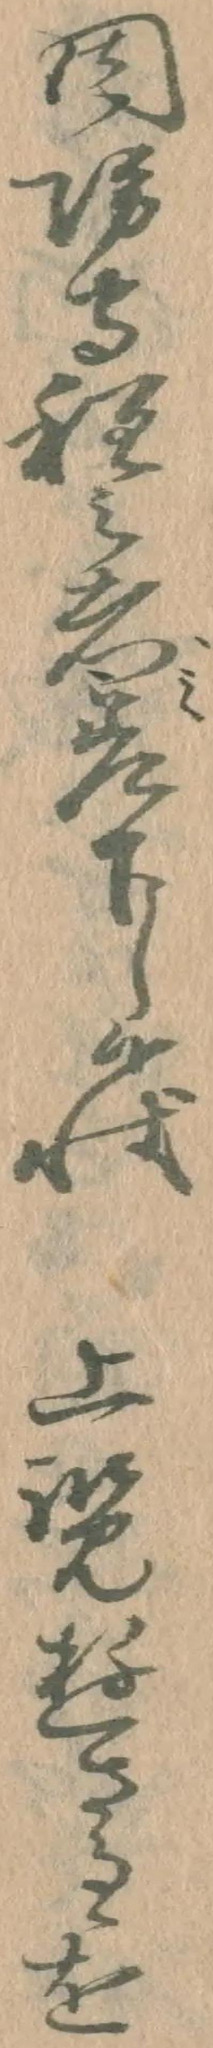周防守程之者・差下し候状上覧遊さるゝを
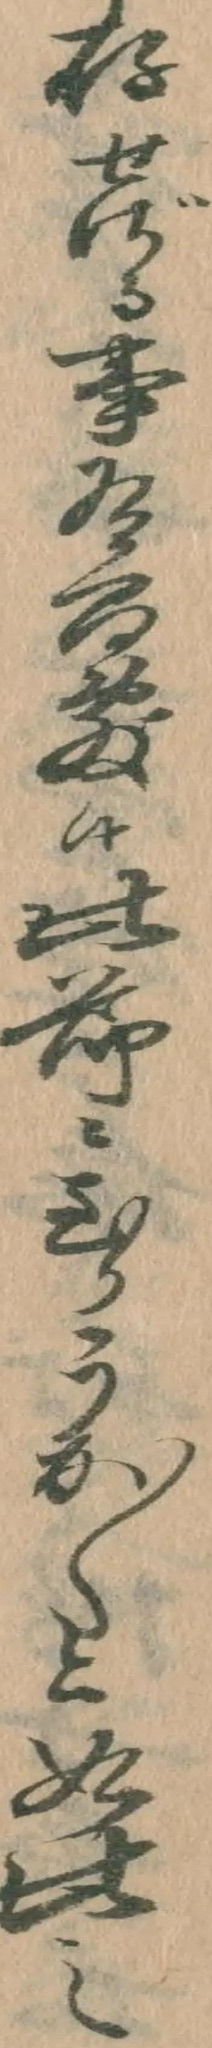存せざる事有間敷候此節に至りうか〳〵と如此之
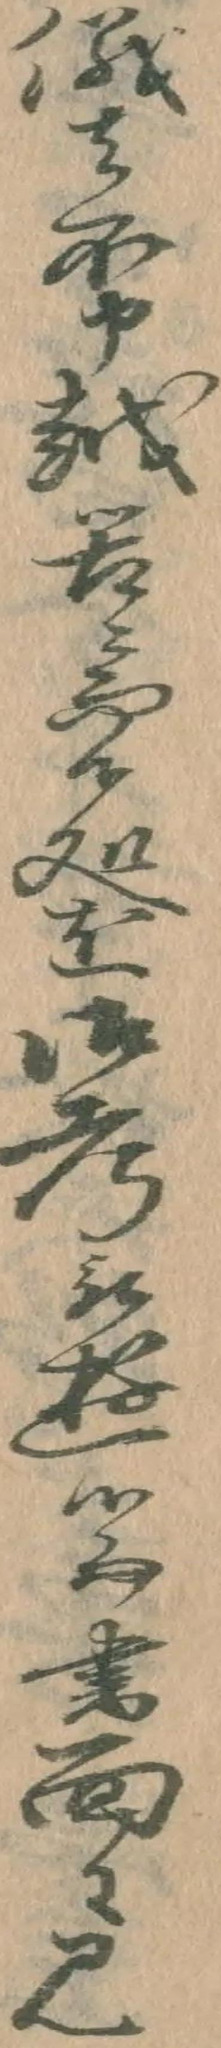儀は不申越筈に而候処を御考被遊候而書面に見
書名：切支丹御退治記 49巻. [1]
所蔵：国立国会図書館 National Diet Library, JAPAN
